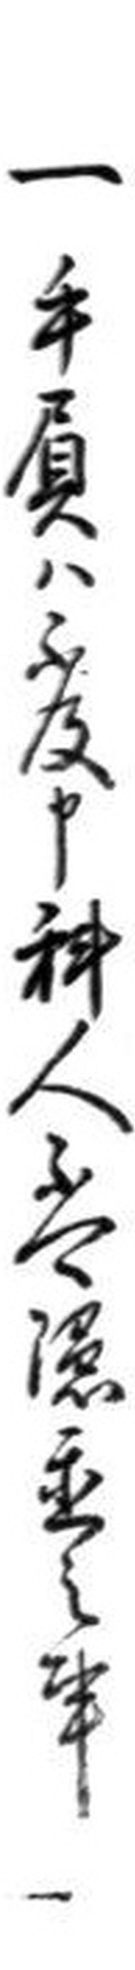一手負ハ不及申科人不可隠置之事
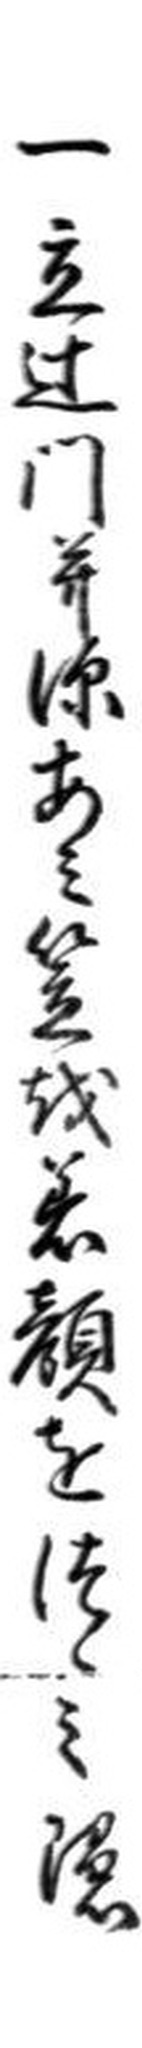一立辻門并深あミ笠を着顔をつゝミ隠
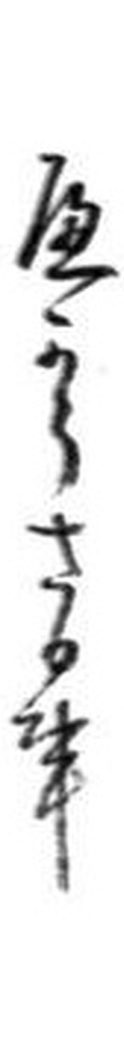へからさる事
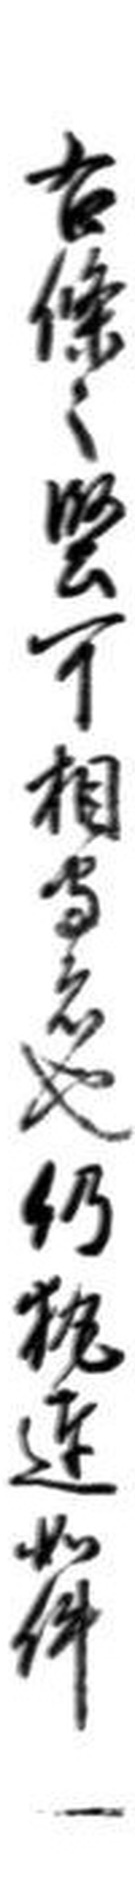右条々堅可相守者也仍執達如件
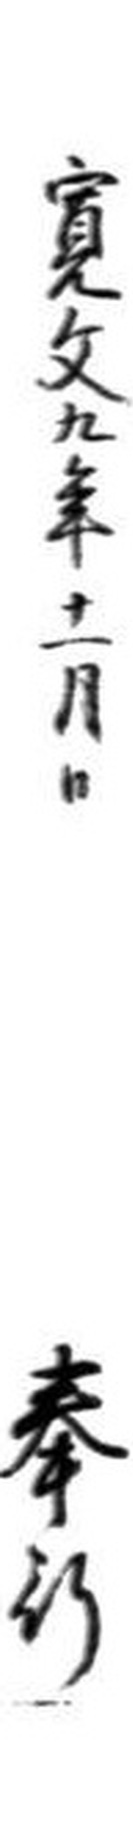寛文九年十一月日奉行
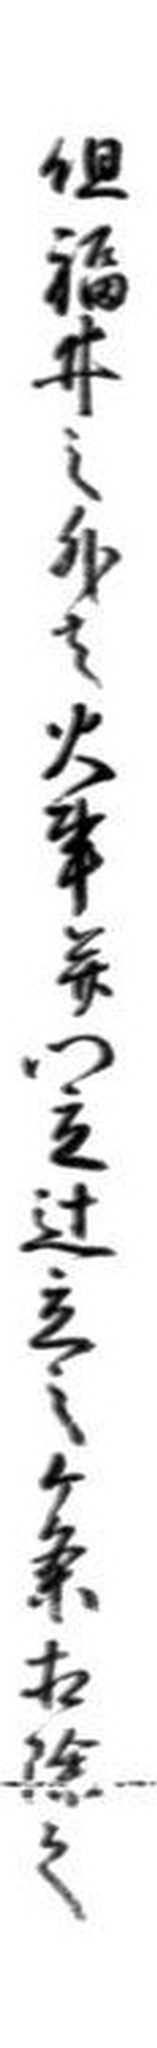但福井之外者火事并門立辻立之ケ条相除之
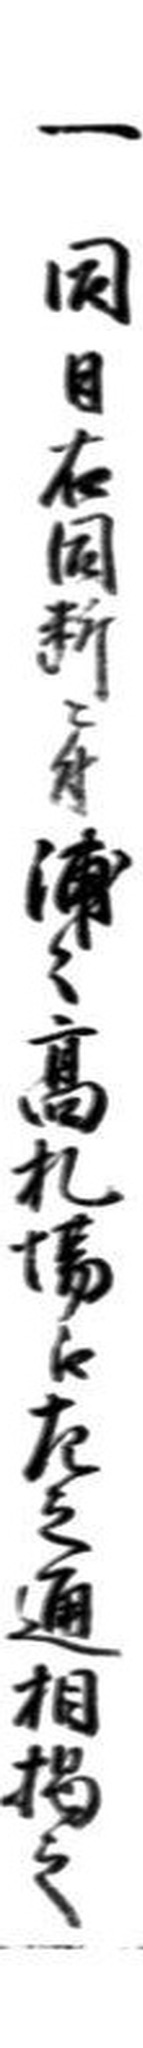一同日右同断ニ付浦々高札場江左之通相掲之
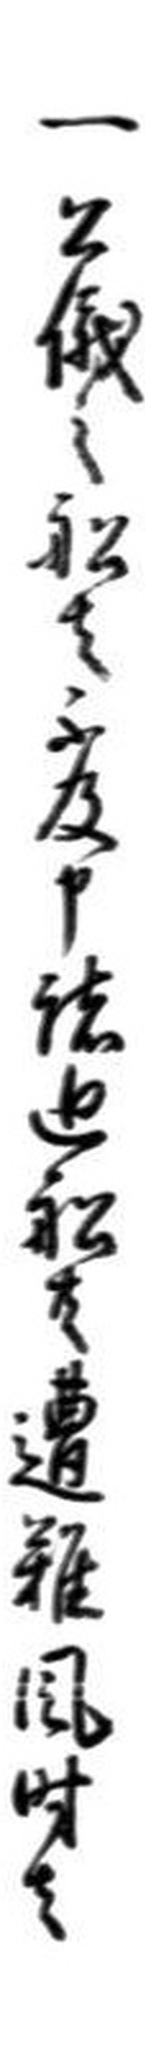一公儀之船者不及申諸廻船共遭難風時者
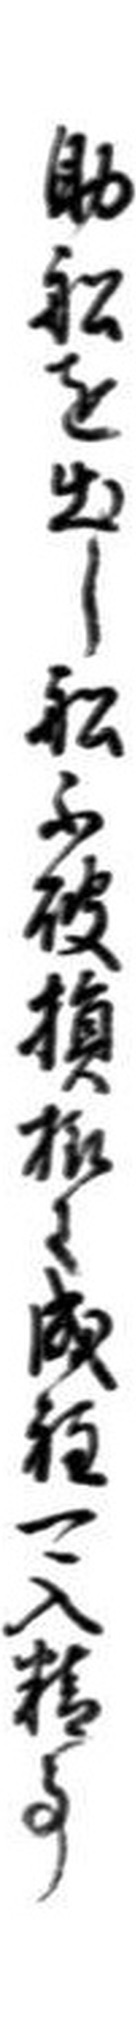助船を出し船不破損様に成程可入精事
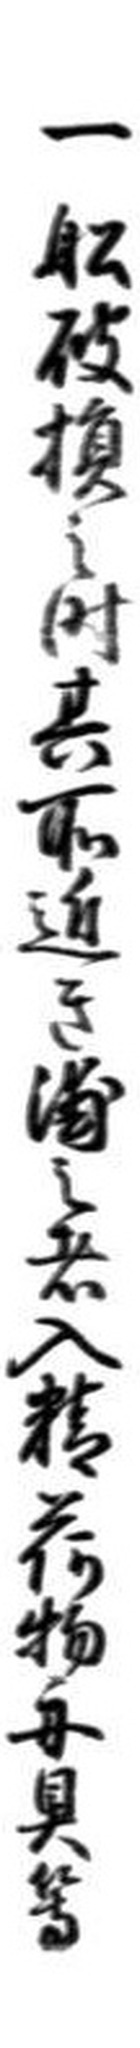一船破損之時其所近き浦之者入精荷物船具等
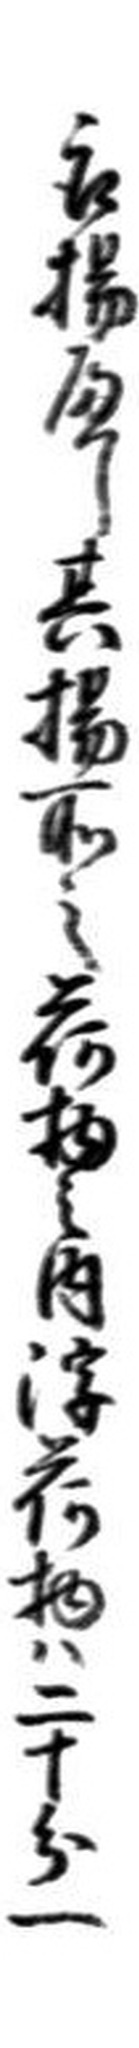取揚へし其揚所之荷物之内浮荷物ハ二十分一

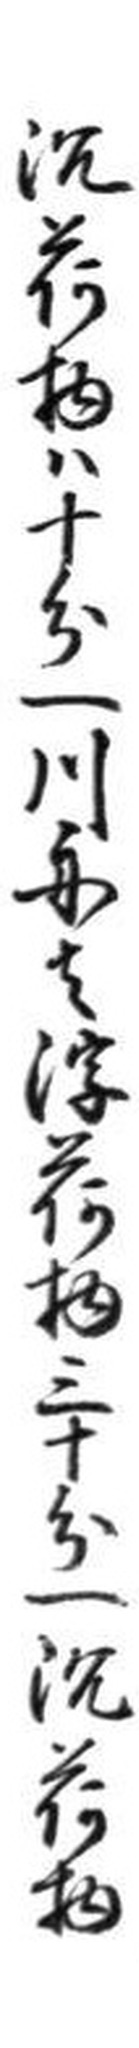沈荷物ハ十分一川舟者浮荷物三十分一沈荷物
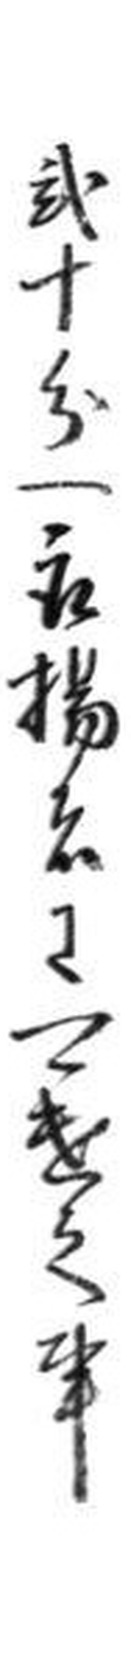弐十分一取揚者に可遣之事
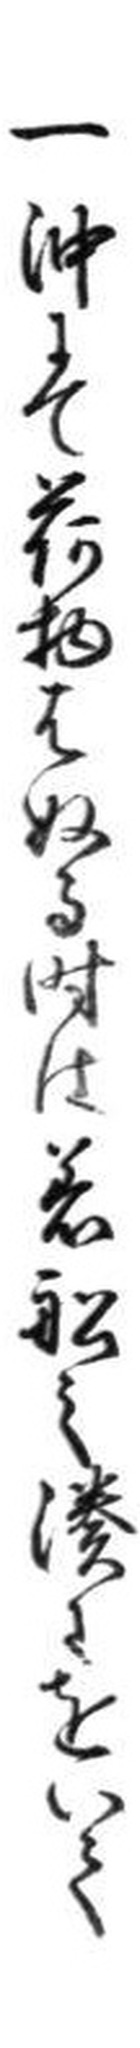一沖にて荷物はぬる時は着船之湊にをいて
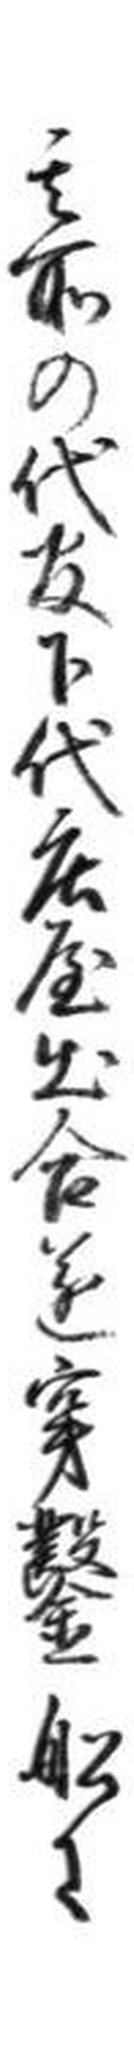其所の代官下代庄屋出合遂穿鑿船に
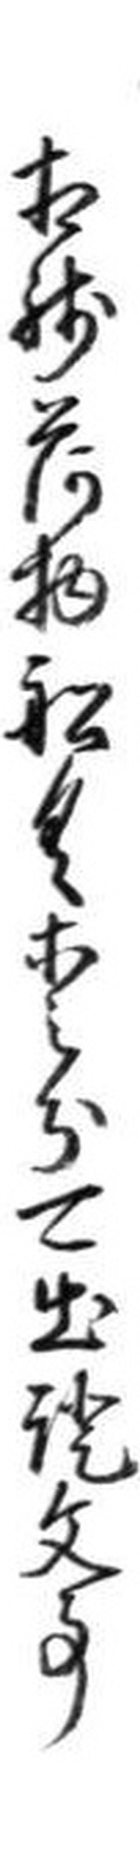相残荷物船具等之分可出証文事
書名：家譜 七 光通公 従寛文四年到同九年
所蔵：福井県文書館 Fukui Prefectural Archives
